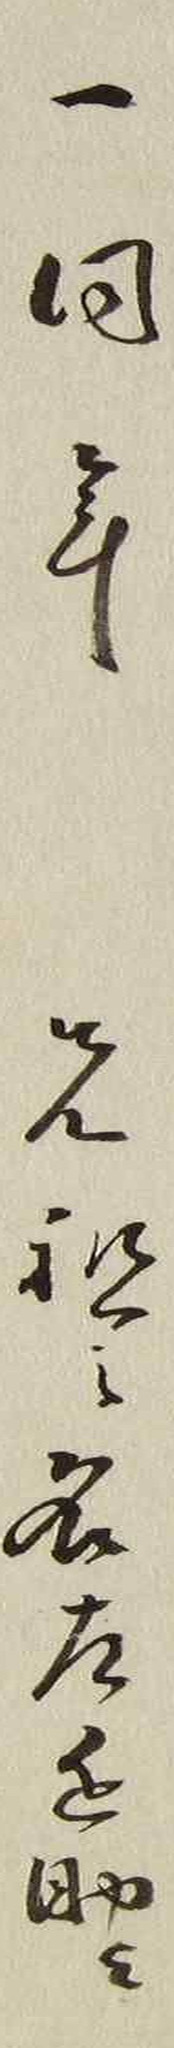一同年先祖名左近助と
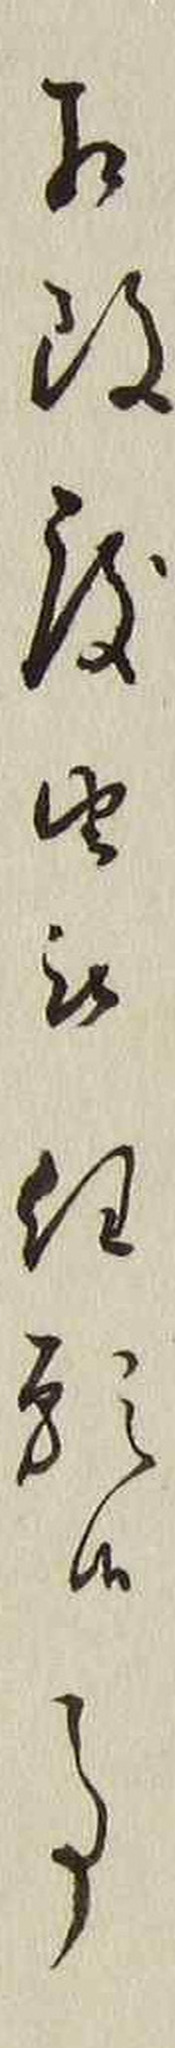相改度由被任願候事
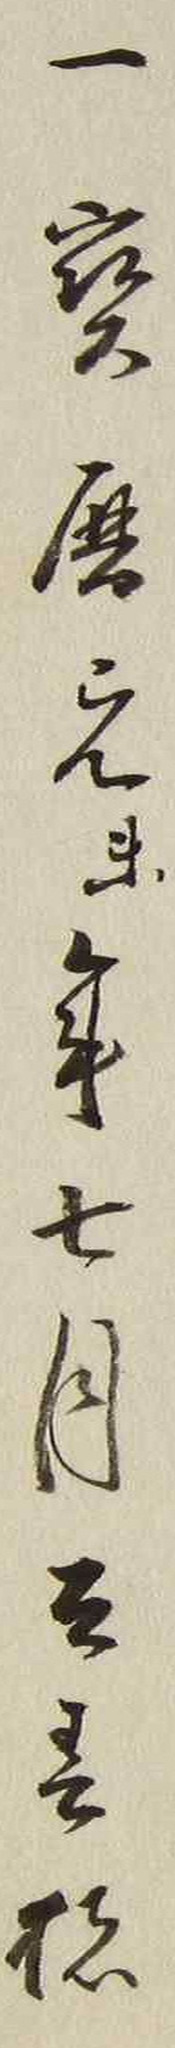一宝暦元未年七月去春猪
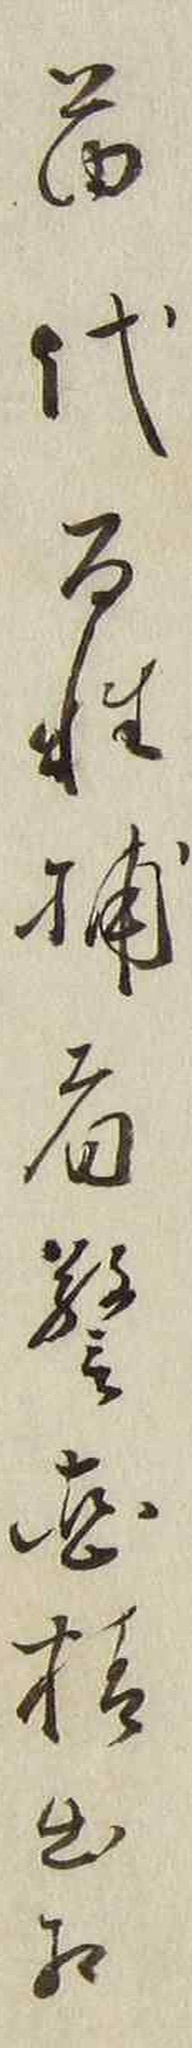苗代百性捕者警固精出地相

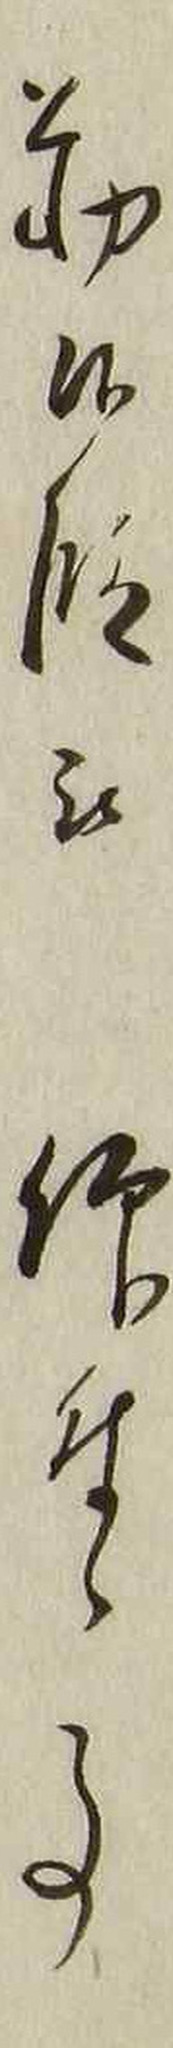勤候段被仰付候事
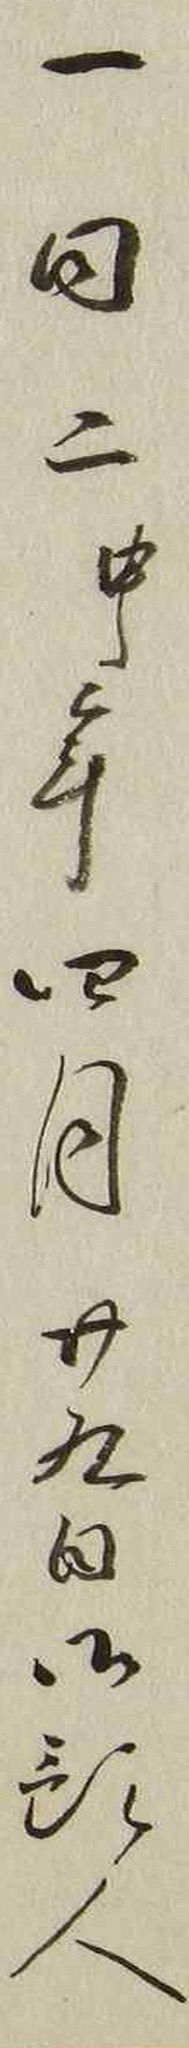一同二申年四月廿九日御預人
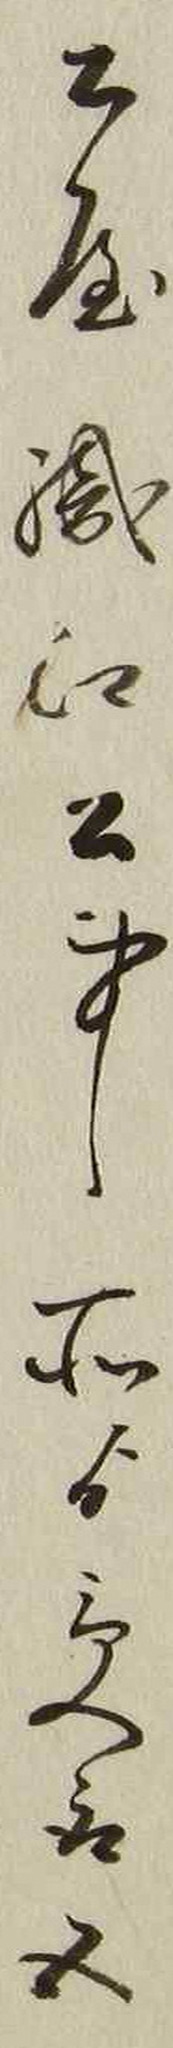土屋織江公事所ゟ受取五
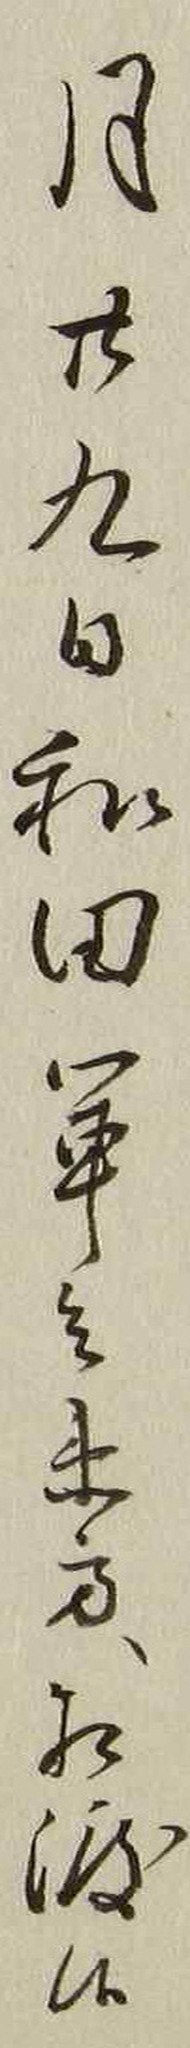月廿九日和田軍兵衛方へ相渡候
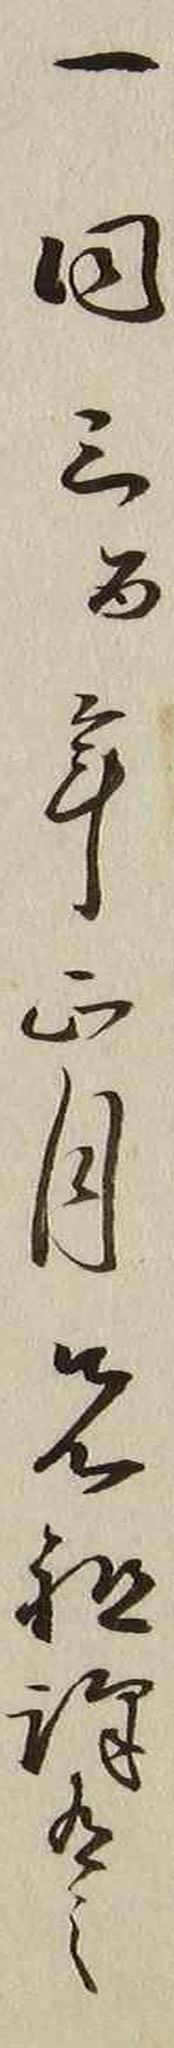一同三丑年正月先祖訳之之
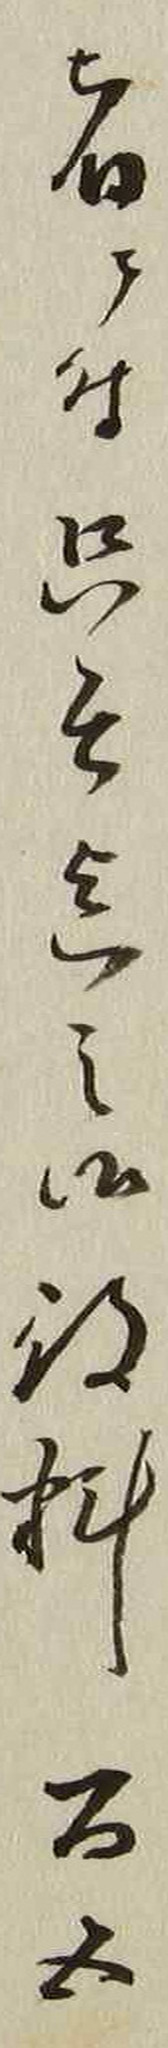者に付只今迄之御役料百五
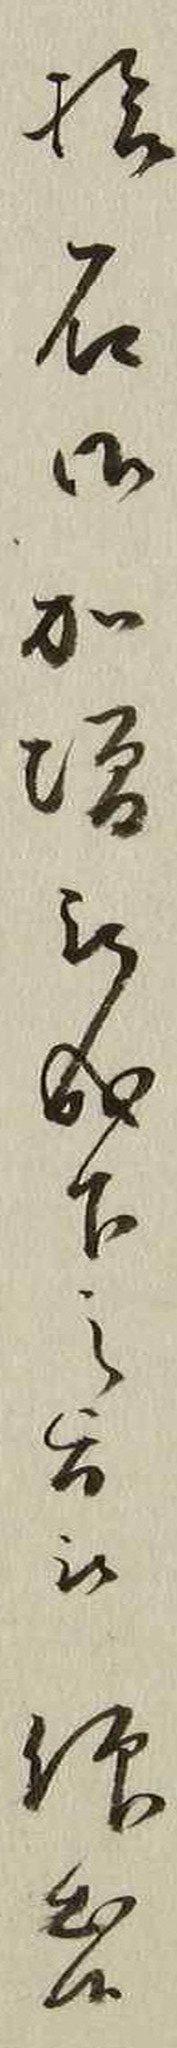拾石御加増被成下之旨被仰出候
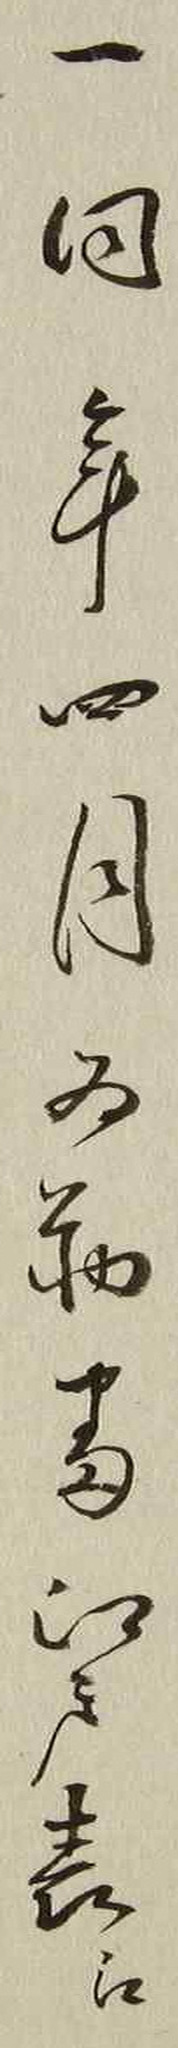一同年四月為勤番江戸表江
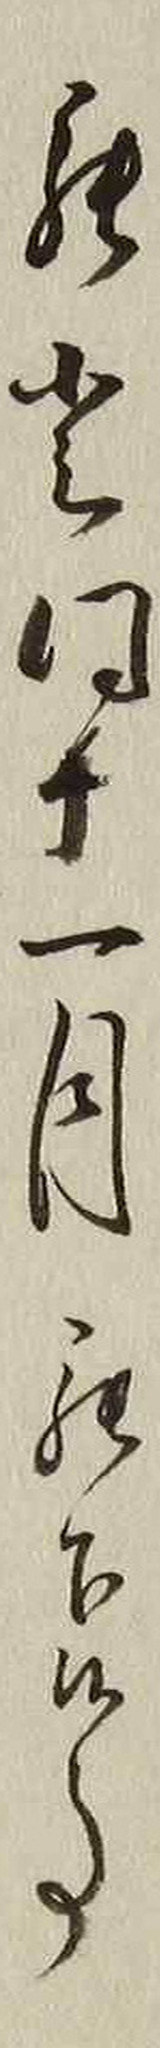罷登同十一月罷下候事
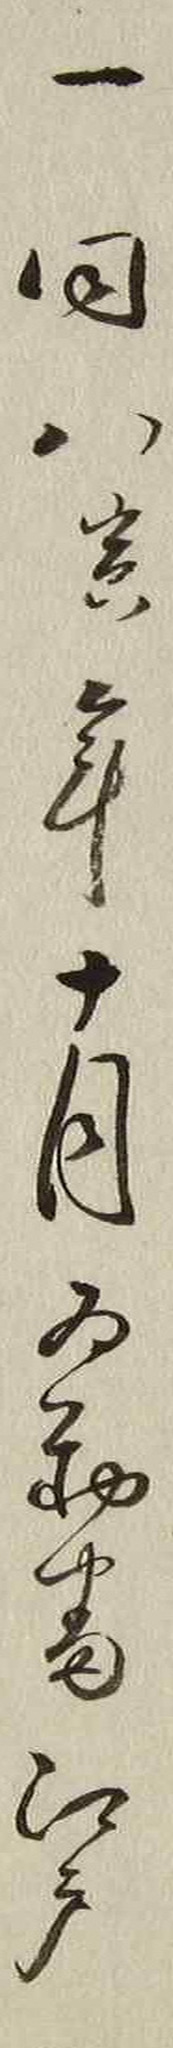一同八寅年十月為勤番江戸
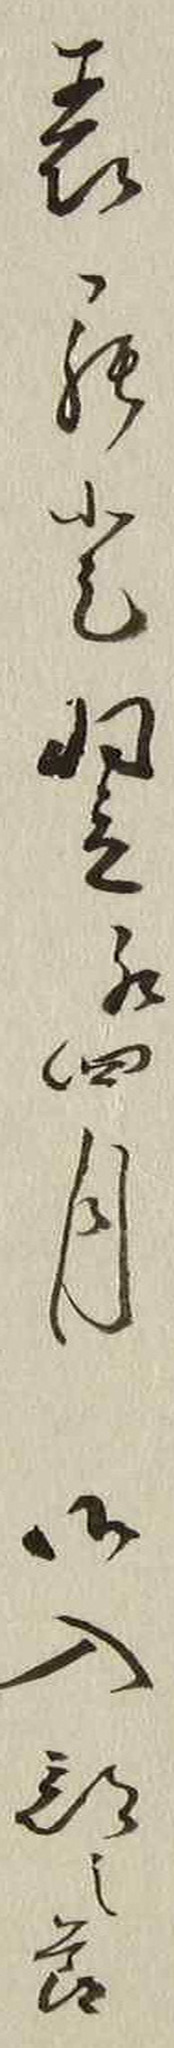表罷登翌卯四月御入部之節
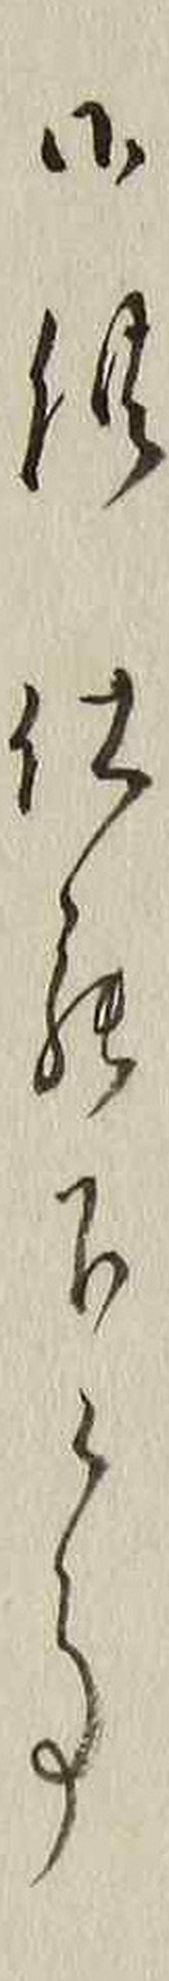御供仕罷下候事
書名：諸士系譜　巻之159　な之部1
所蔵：会津若松市立会津図書館
